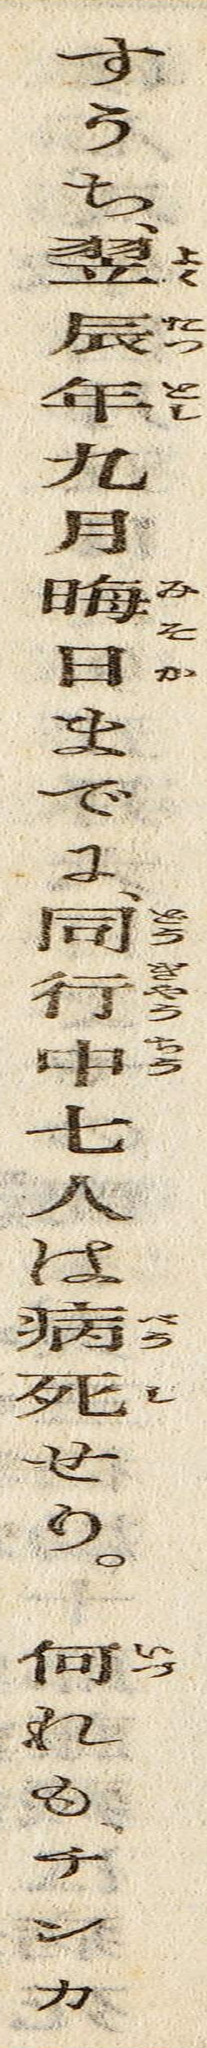すうち、翌辰年九月晦日までに、同行中七人は病死せり。何れも、チンカ
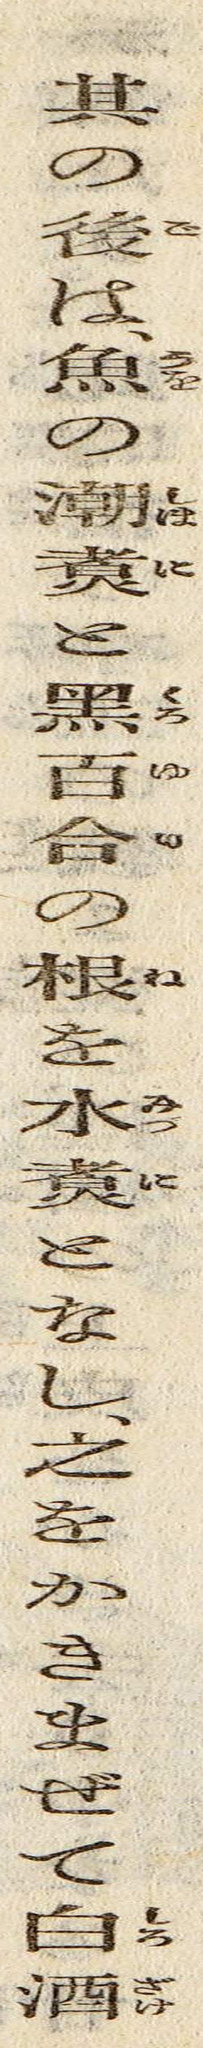其の後は、魚の潮煮と黒百合の根を水煮となし、之をかきまぜて白酒
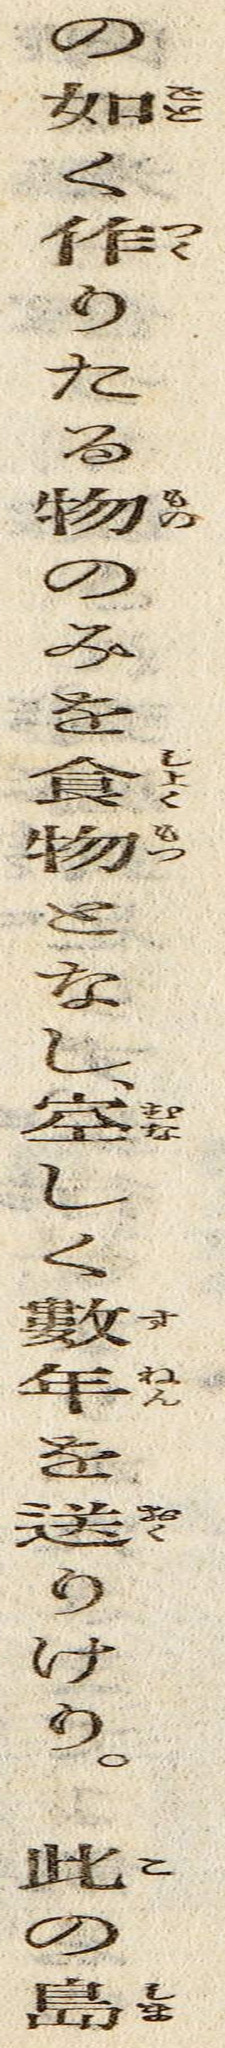の如く作りたる物のみを食物となし、空しく数年を送りけり。此の島
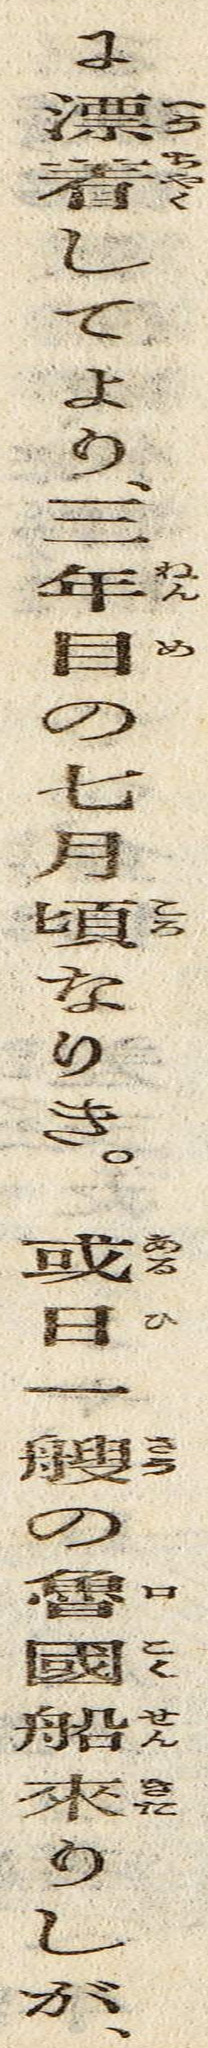に漂着してより、三年目の七月頃なりき。或日一艘の魯国船来りしが、
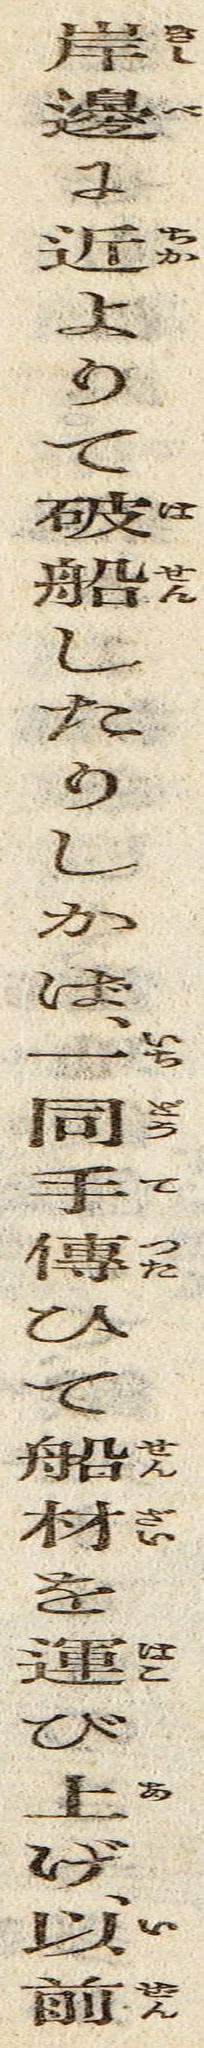岸辺に近よりて破船したりしかば、一同手伝ひて船材を運び上げ、以前
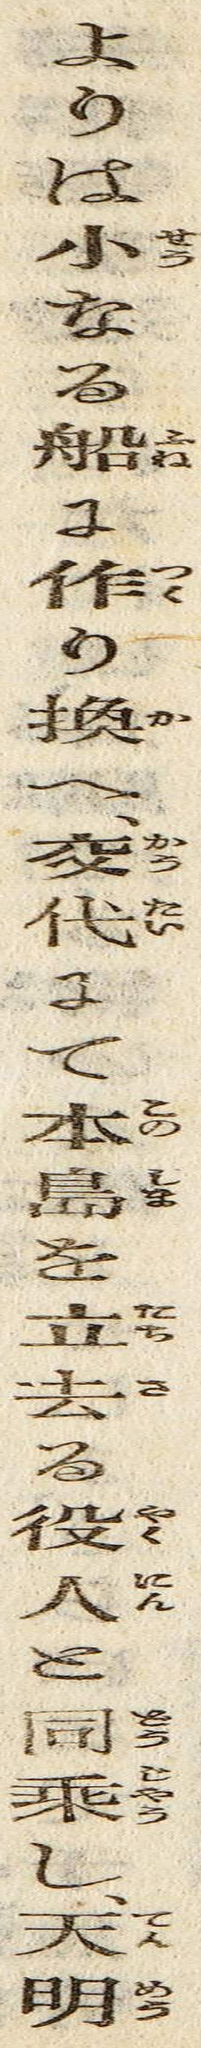よりは小なる船に作り換へ、交代にて本島を立去る役人と同乗し、天明
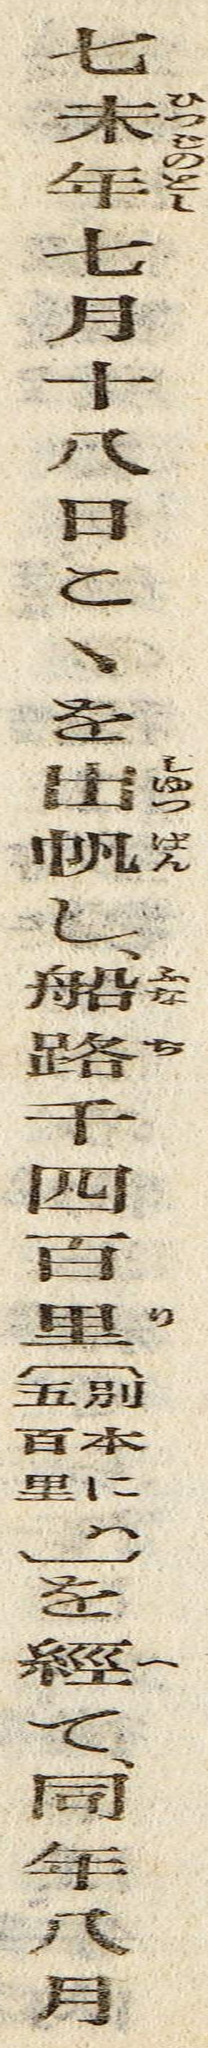七未年七月十八日こゝを出帆し、船路千四百里[別本にハ五百里]を経て、同年八月
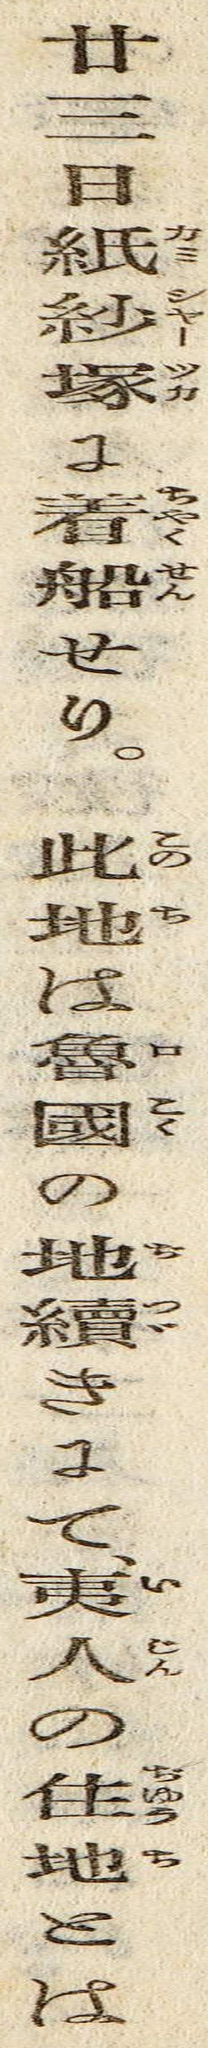廿三日紙紗塚に着船せり。此地は魯国地続きにて、夷人の住地とは
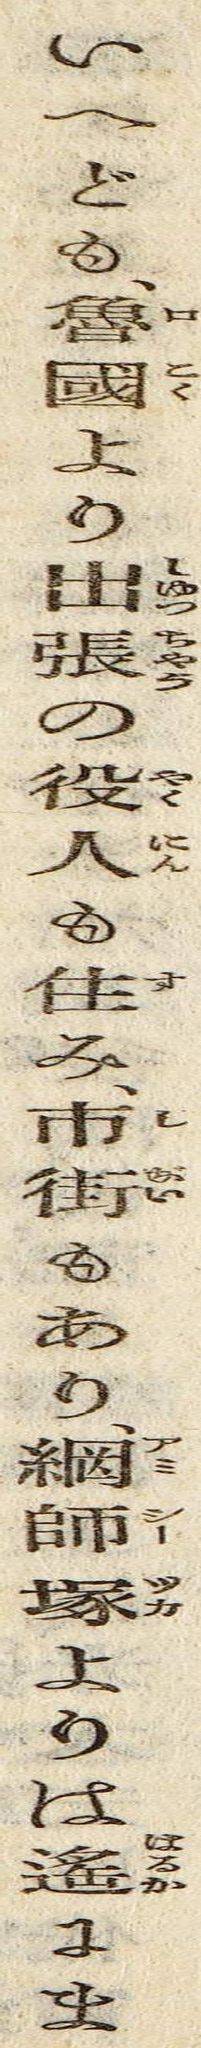いへども、魯国より出張の役人も住み、市街もあり、網師塚よりは遥にま

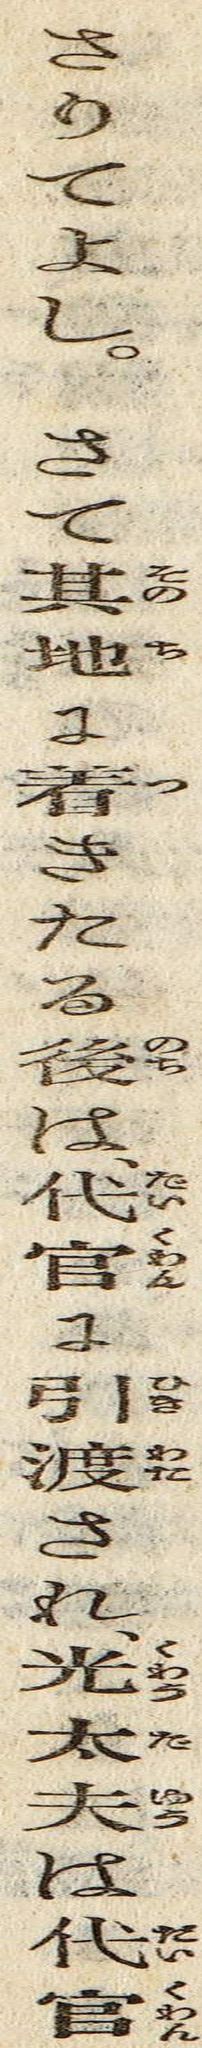さりてよし。さて其地に着きたる後は、代官に引渡され、光太夫は代官
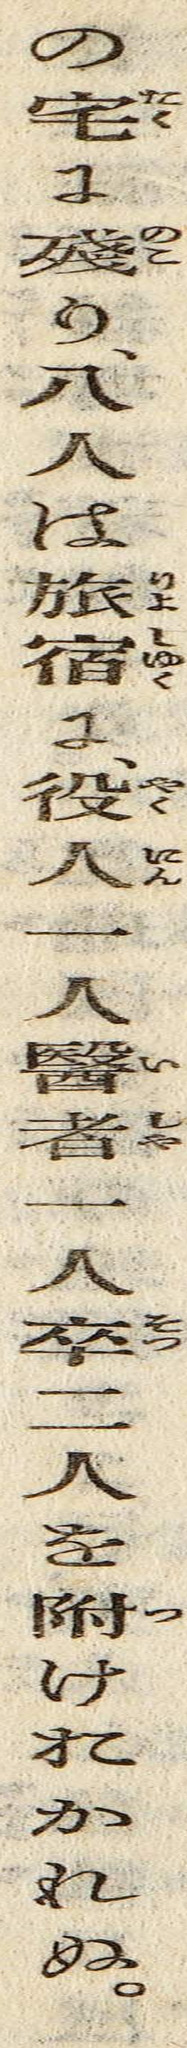の宅に残り、八人は旅宿に、役人一人医者一人卒二人を附けおかれぬ。
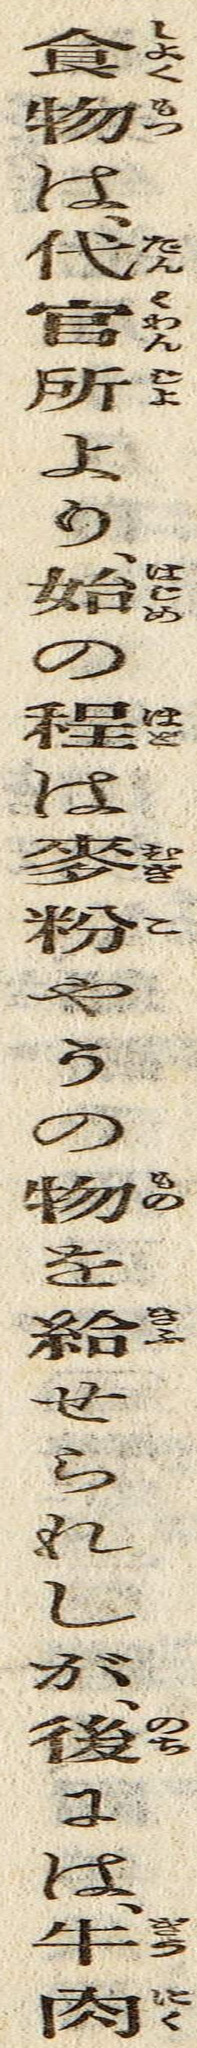食物は、代官所より、始の程は麦粉やうの物を給せられしが、後には、牛肉
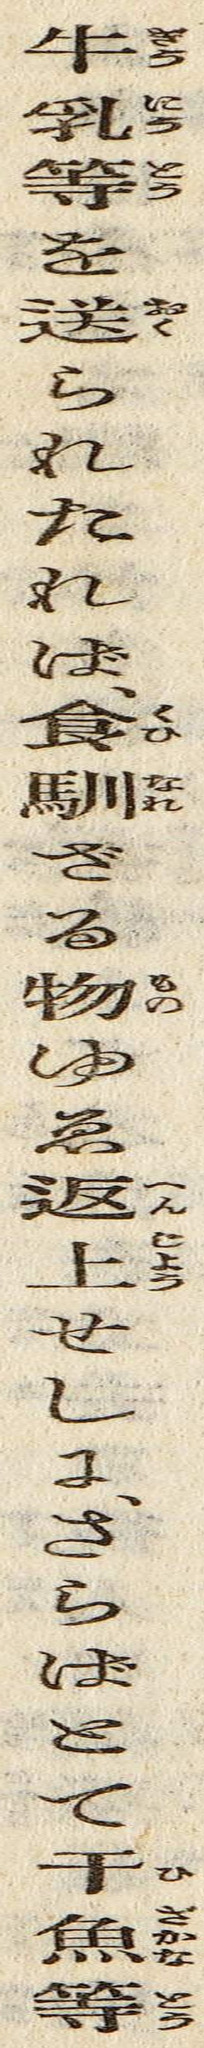牛乳等を送られたれば、食馴ざる物ゆえ返上せしに、さらばとて干魚等
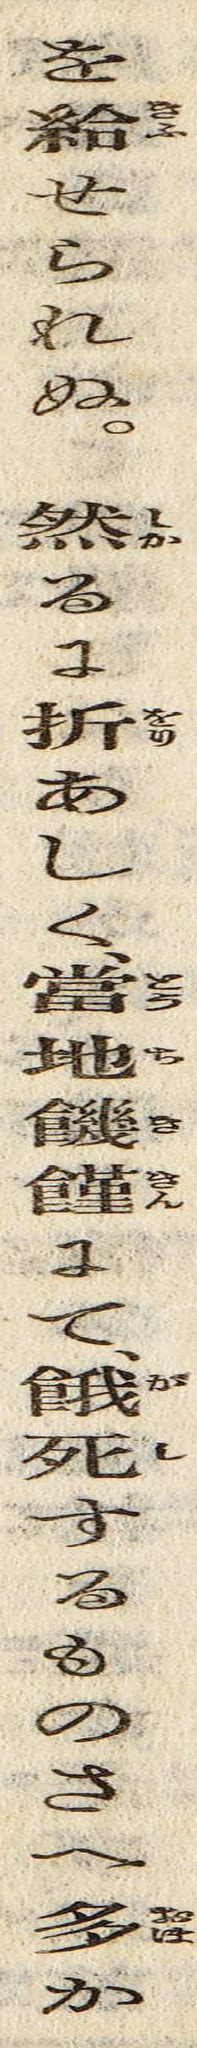を給せられぬ。然るに折あしく、当地飢饉にて、餓死するものさへ多か
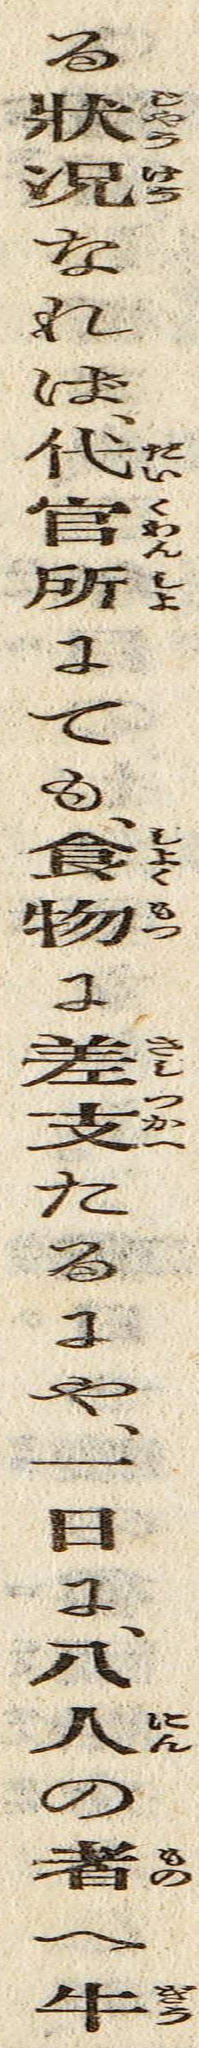る状況なれば、代官所にても、食物に差支たるにや、一日に、八人の者へ牛
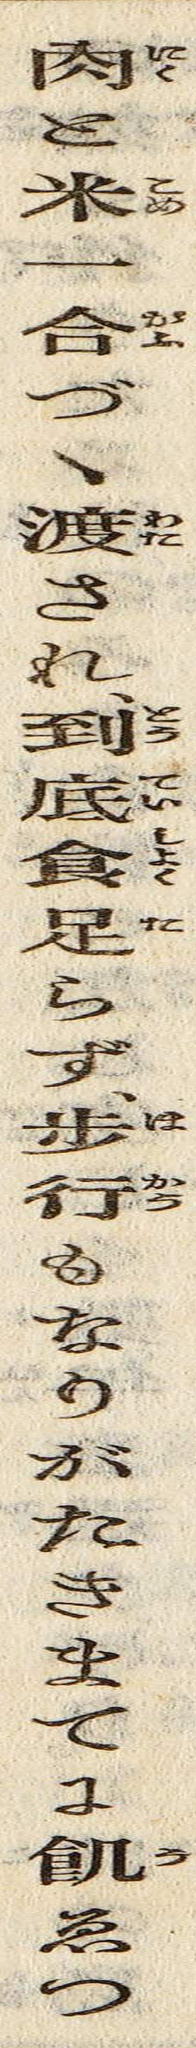肉と米一合づゝ渡され、到底食足らず、歩行もなりがたきまでに飢えつ
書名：日本漂流譚
